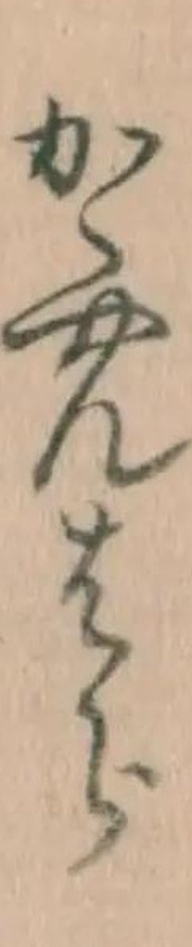かゝやんはら
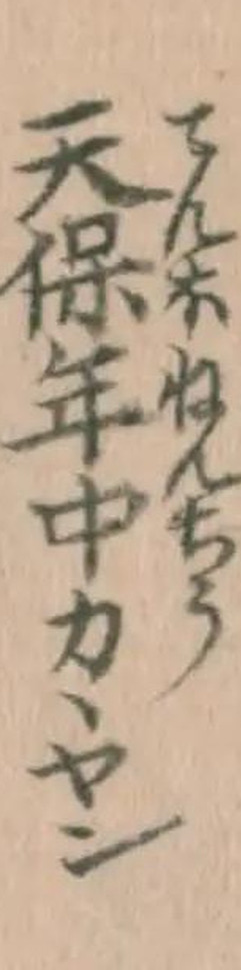天保年中カヽヤン
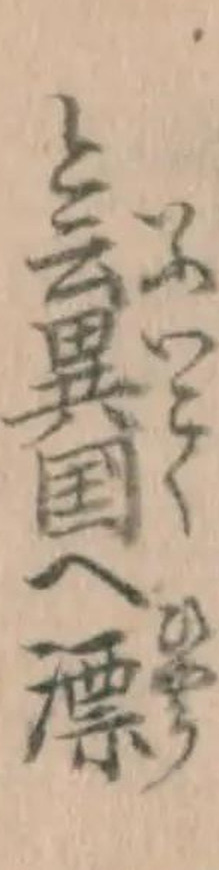と云異国へ漂
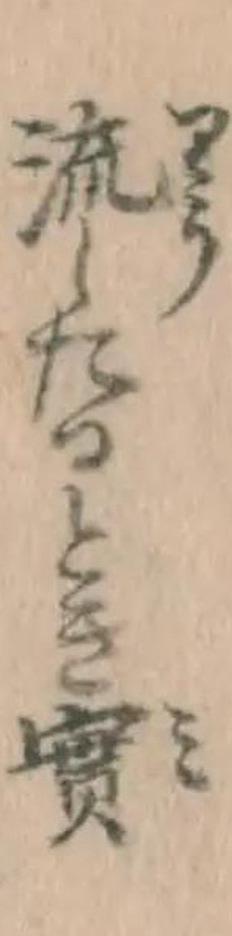流したるとき実
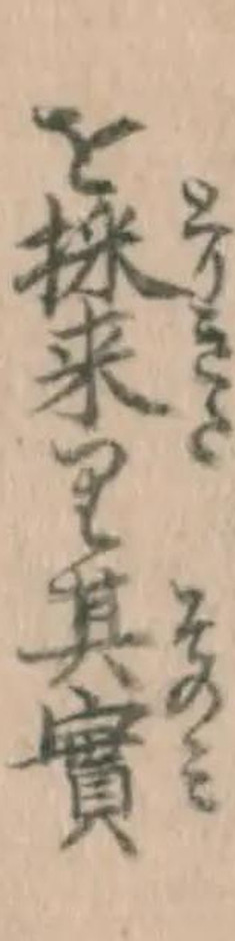を採来り其実
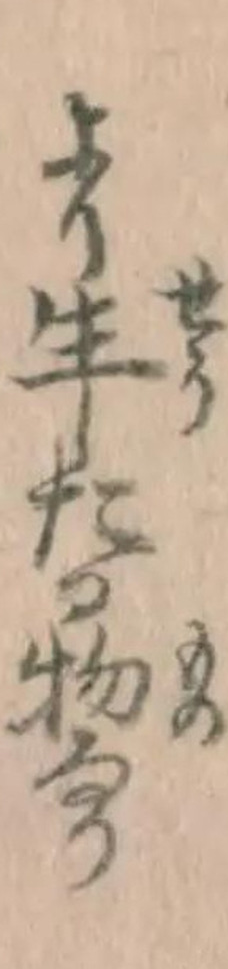より生したる物なり
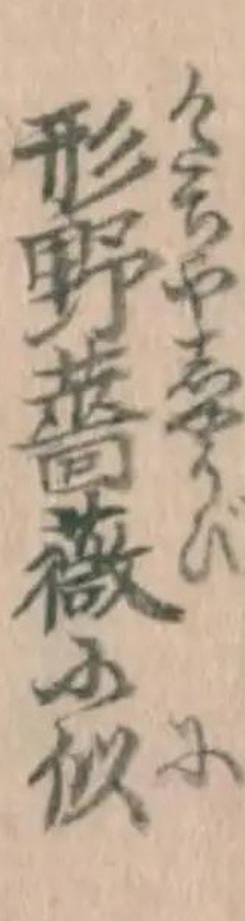形野薔薇に似
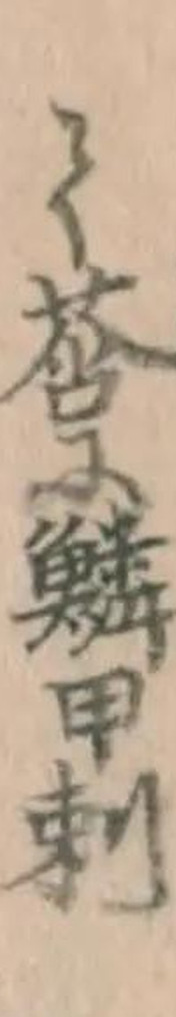て莟に鱗甲剌
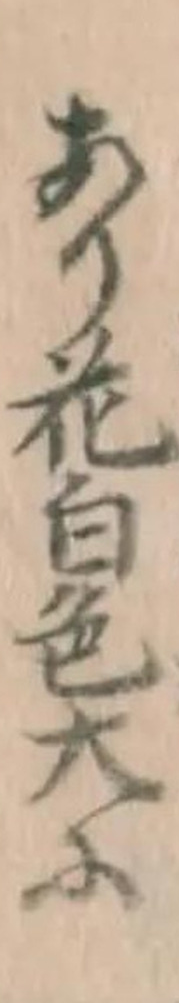あり花白色大に
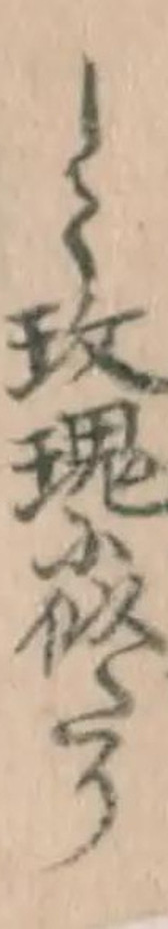して玟瑰に似たり
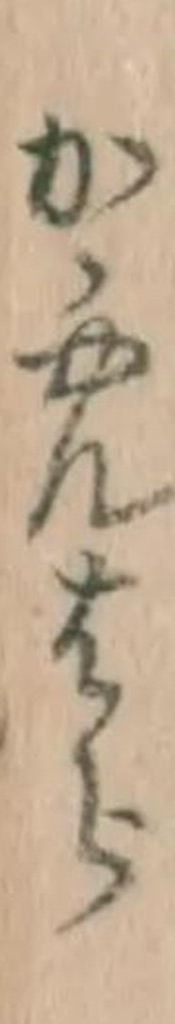かゝやんはら

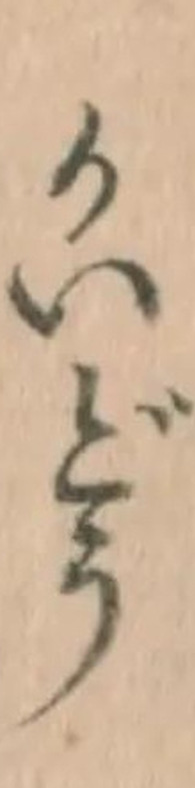かいどう
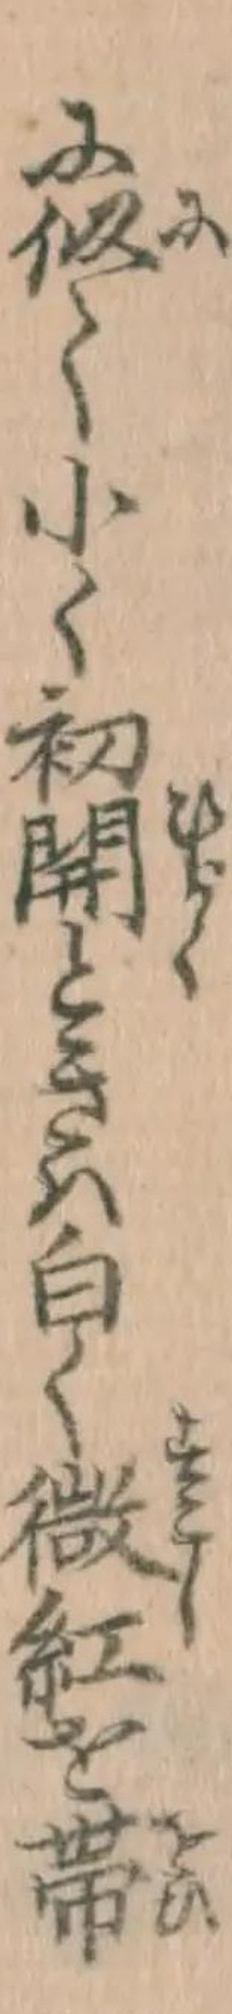に似て小く初開ときは白く微紅を帯
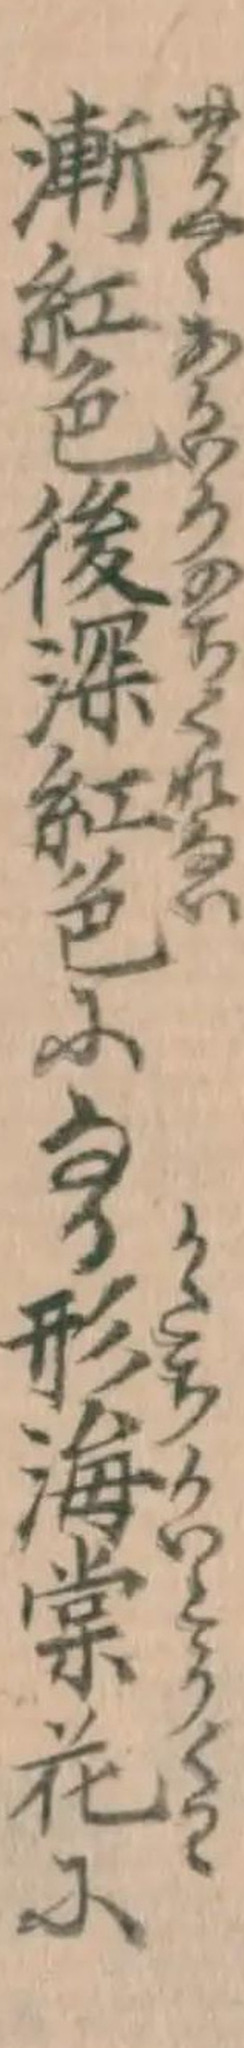漸紅色後深紅色になり形海棠花に
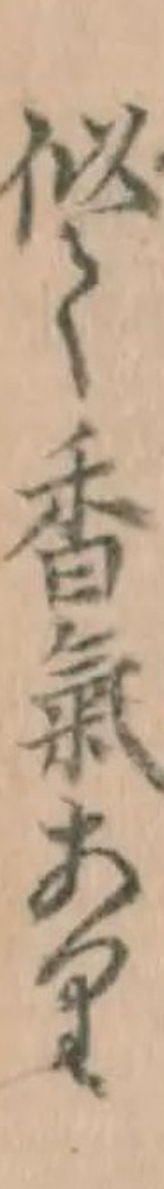似て香気あり
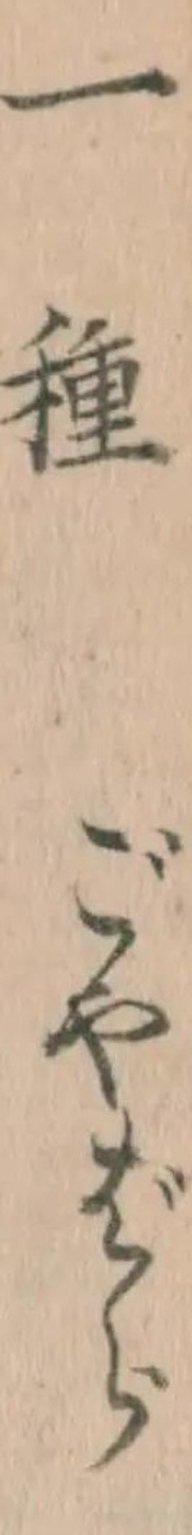一種ごやばら
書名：本草図譜. 巻25-27
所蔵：国立国会図書館 National Diet Library, JAPAN
